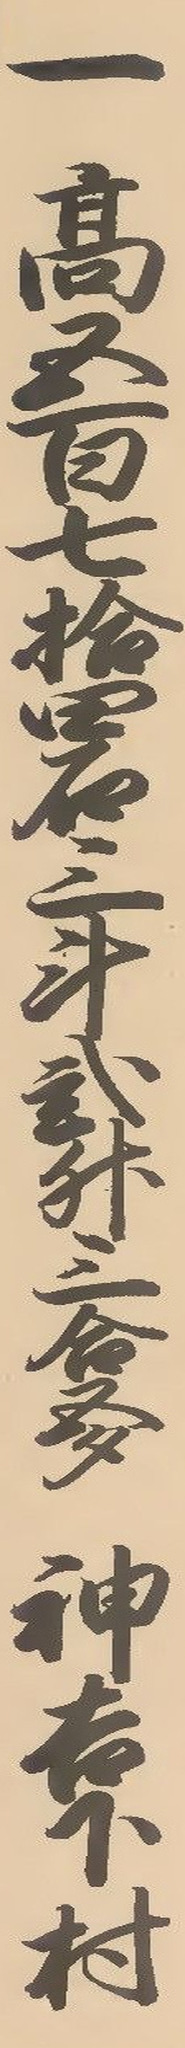一高五百七拾四石三斗弐升三合五勺神吉下村
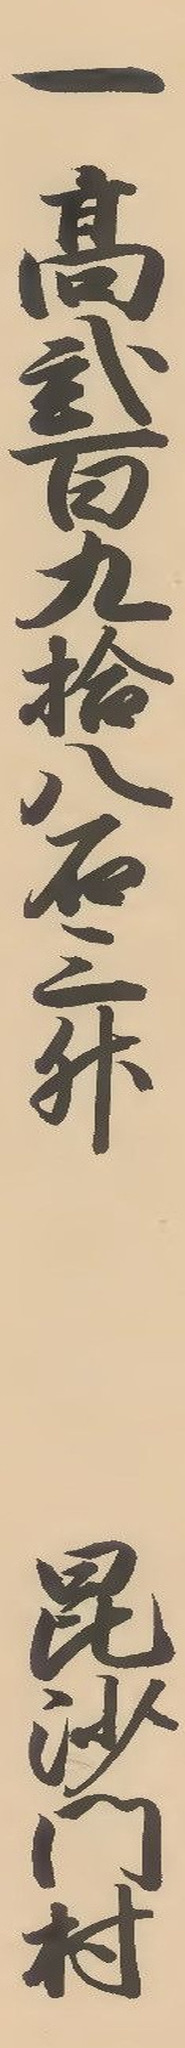一高弐百九拾八石三升昆沙門村
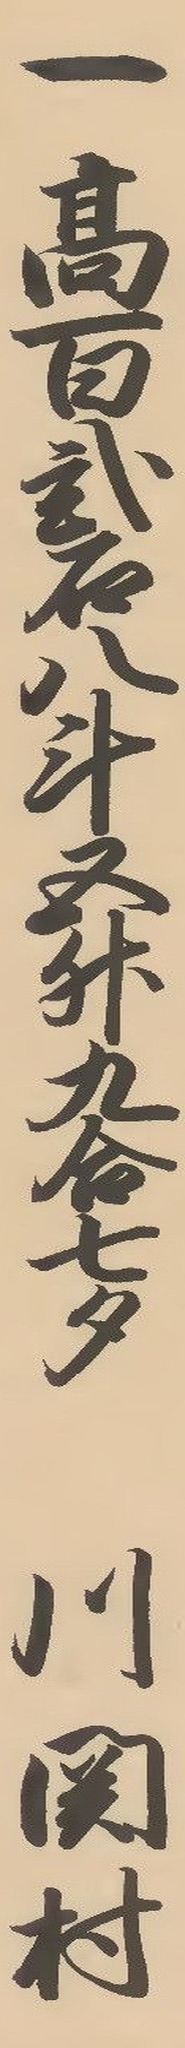一高百弐石八斗五升九合七勺川関村
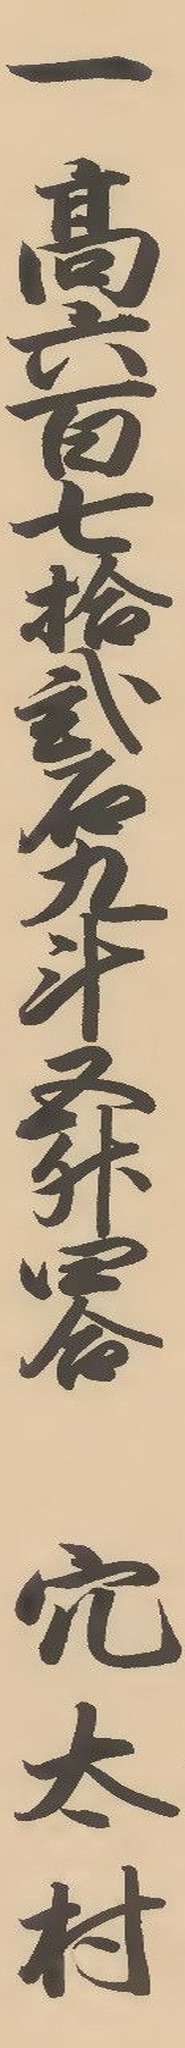一高六百七拾弐石九斗五升四合穴太村

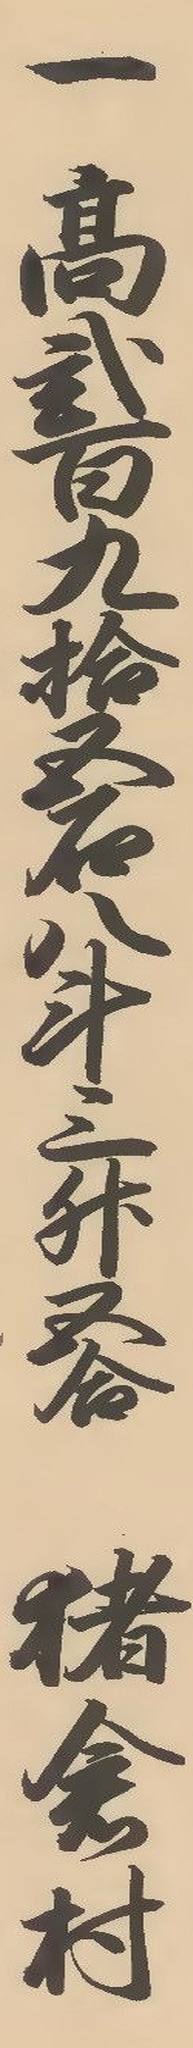一高弐百九拾五石八斗三升五合猪倉村
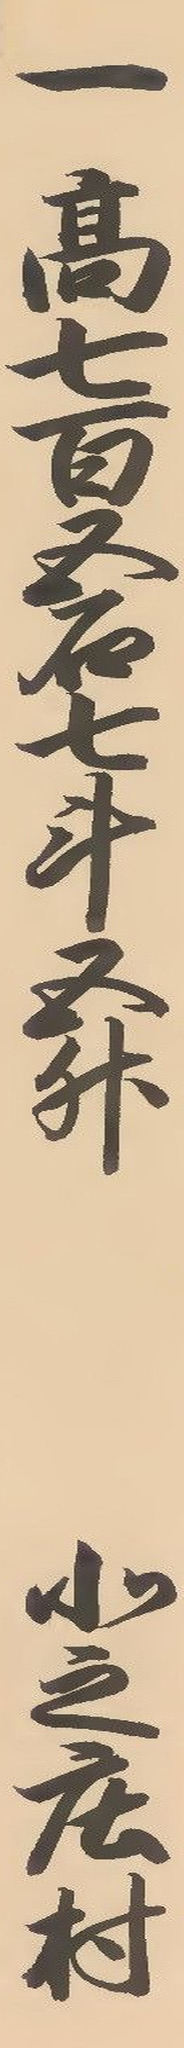一高七百五石七斗五升北之庄村
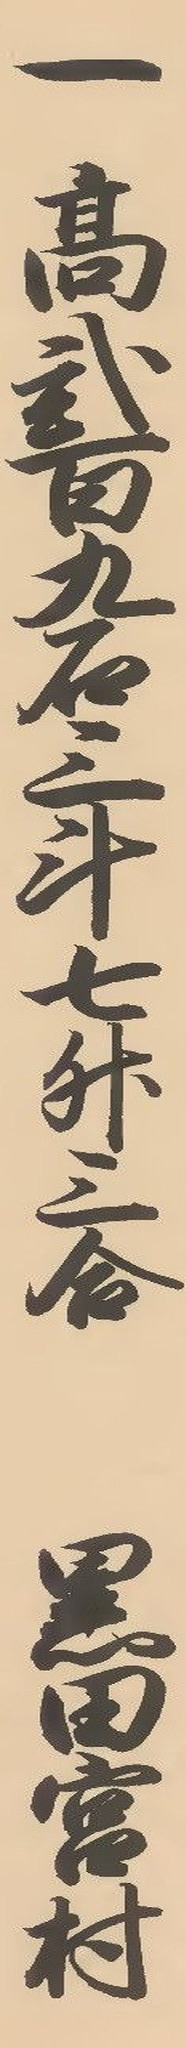一高弐百九石三斗七升三合黒田宮村
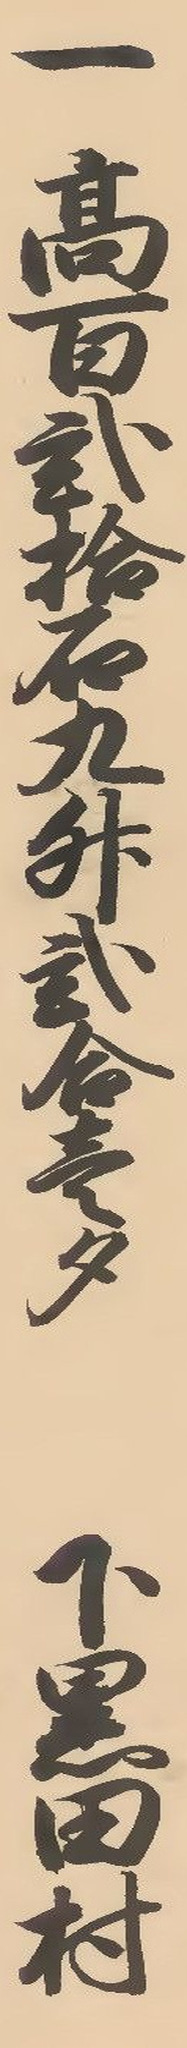一高百弐拾石九升弐合壱勺下黒田村

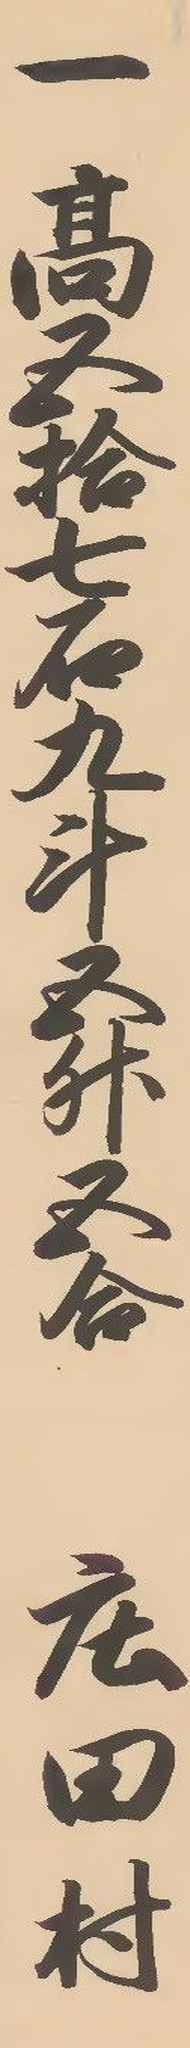一高五拾七石九斗五升五合庄田村
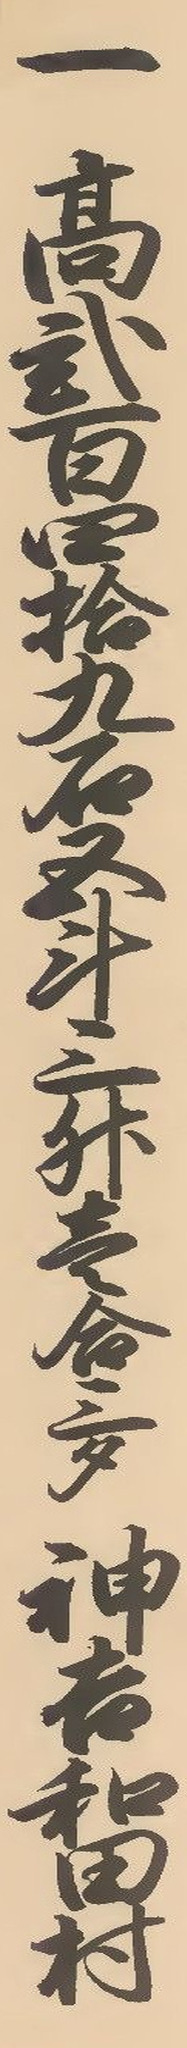一高弐百四拾九石五斗三升壱合三勺神吉和田村
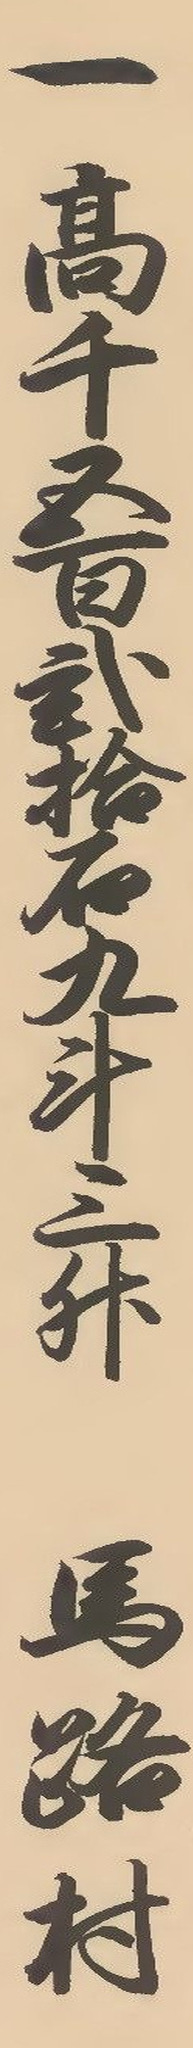一高千五百弐拾石九斗三升馬路村
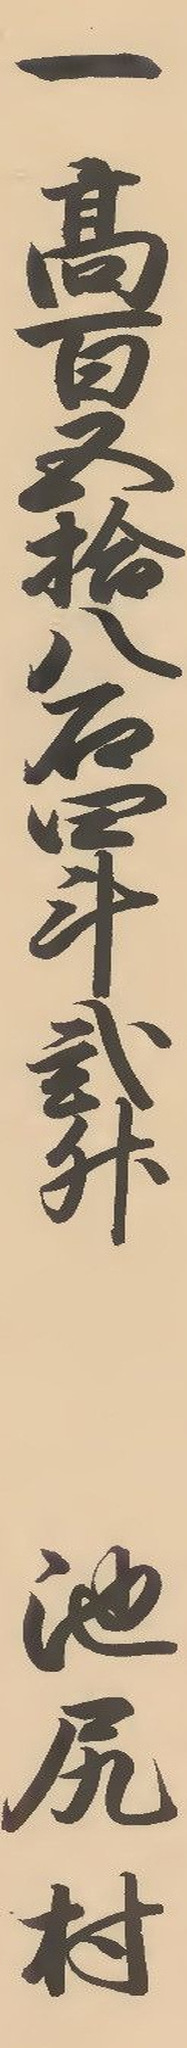一高百五拾八石四斗弐升池尻村
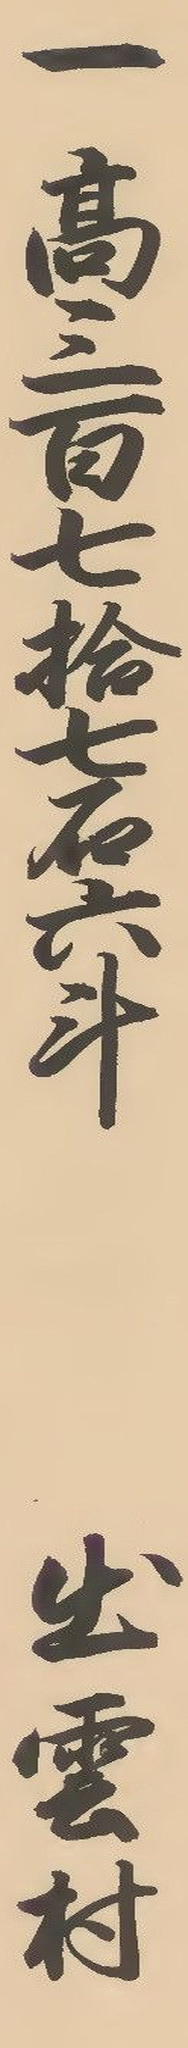一高三百七拾七石六斗出雲村

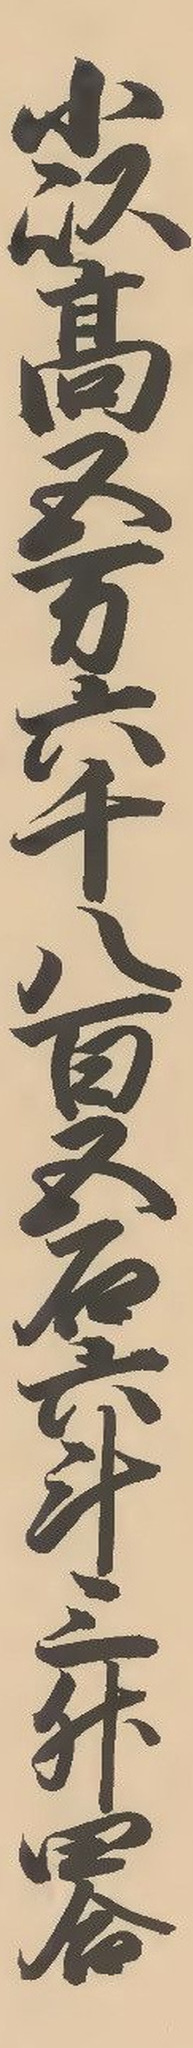小以高五万六千八百五石六斗三升四合

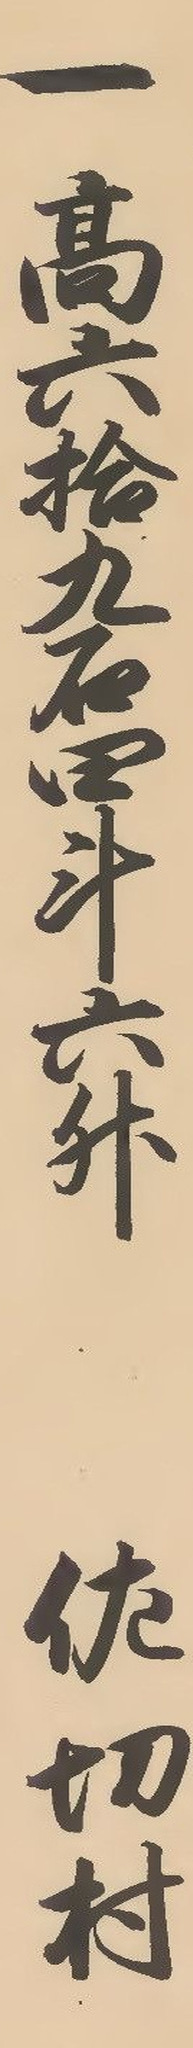一高六拾九石四斗六升佐切村
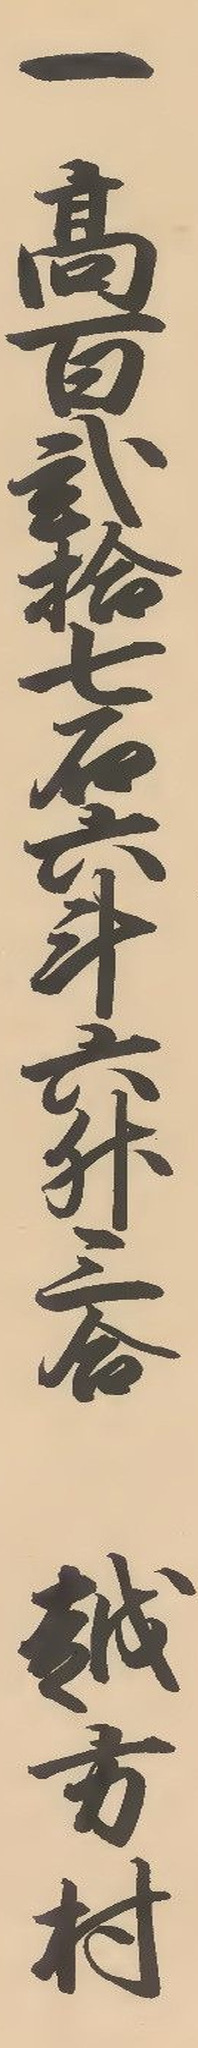一高百弐拾七石六斗六升三合越方村
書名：丹波国郷帳
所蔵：国立公文書館 National Archives of Japan
